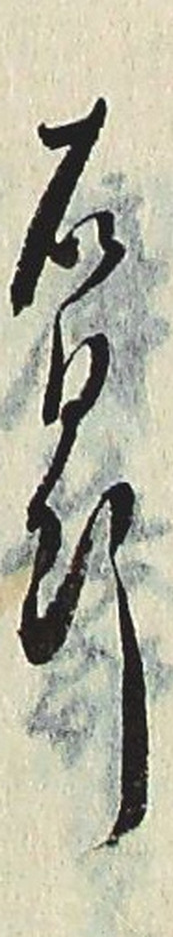十二日
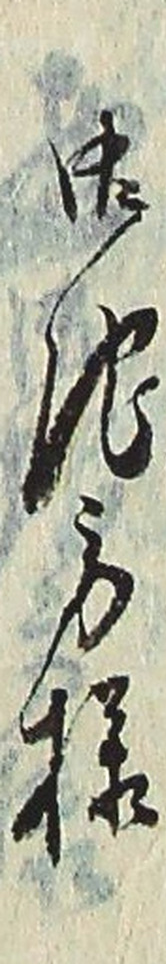御地方様
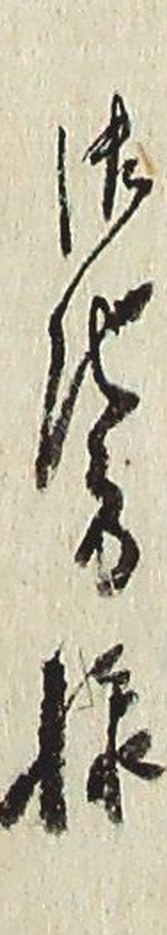御地方様
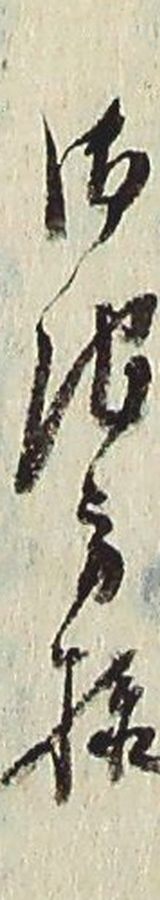御地方様
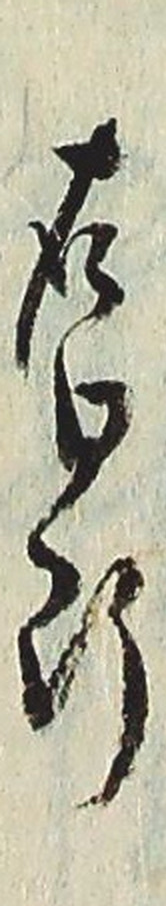十一日
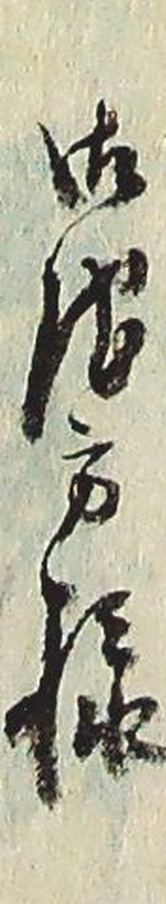御地方様
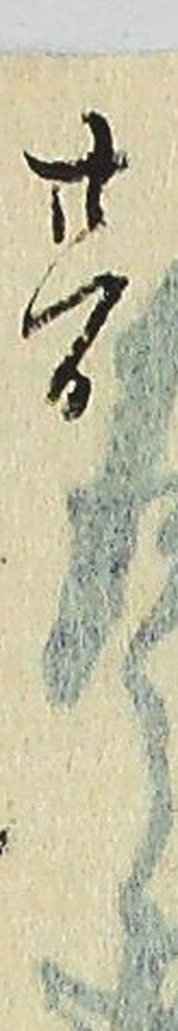廿一日
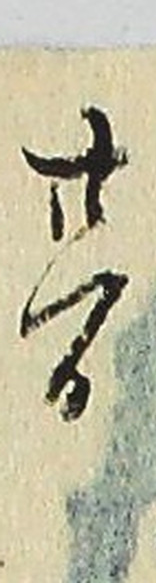廿一日
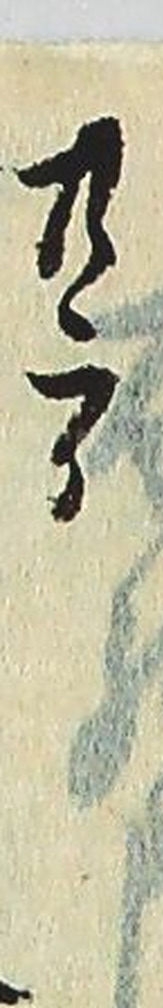廿二日
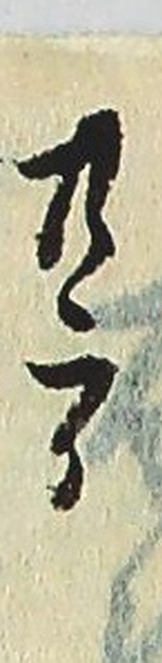廿二日
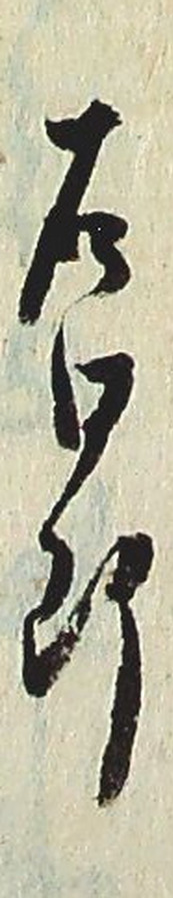一昼夜右同断
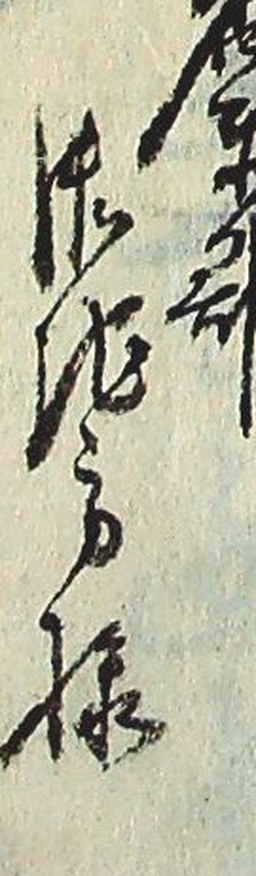御地方様
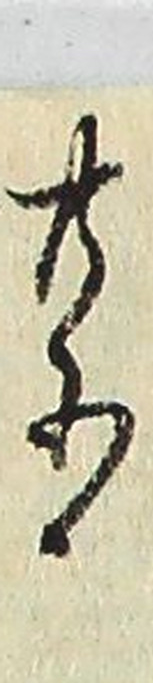廿五日
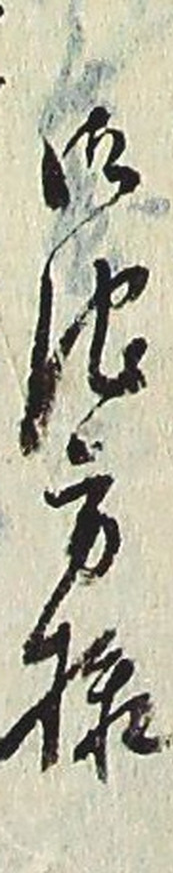御地方様
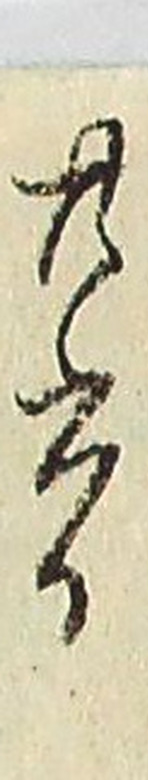廿六日
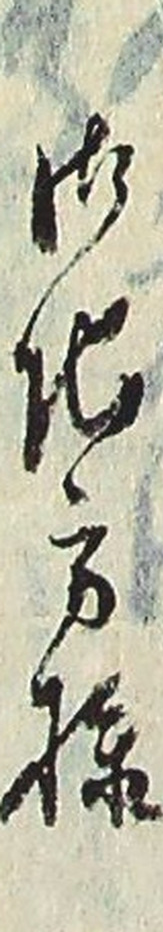御地方様
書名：名東郡中諸割賦元帳
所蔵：鳴門教育大学 Naruto University of Education
